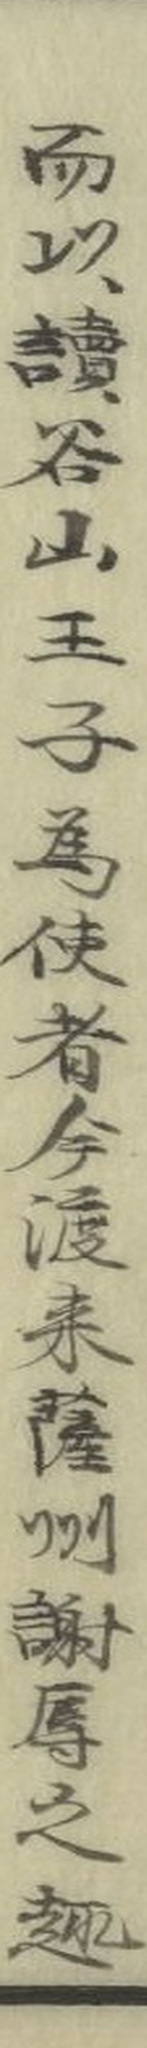而以読谷山王子為使者今渡来薩州謝辱之趣
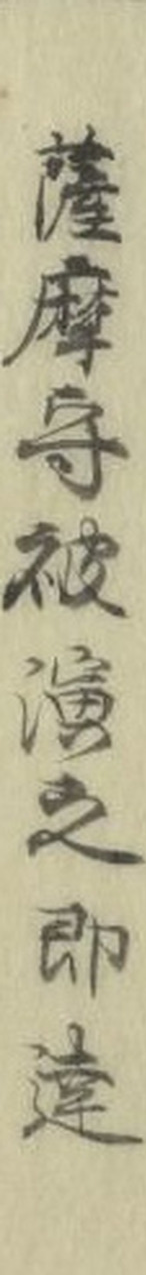薩摩守被演之即達
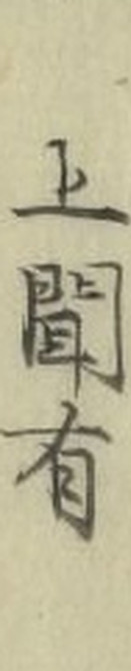上聞有
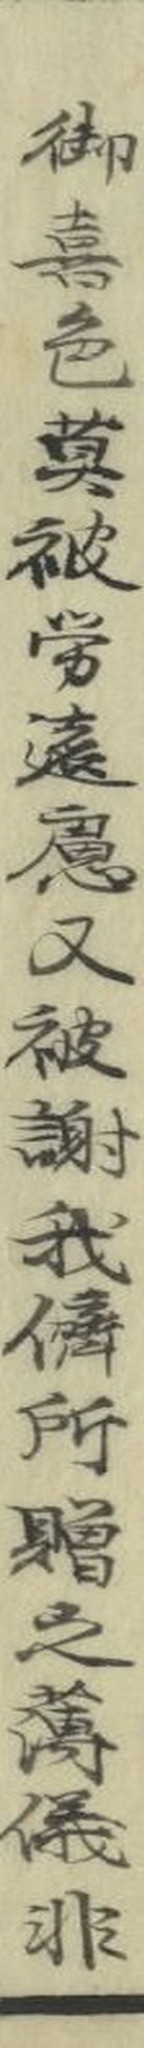御喜色莫被労遠慮又被謝我済所贈之薄儀非
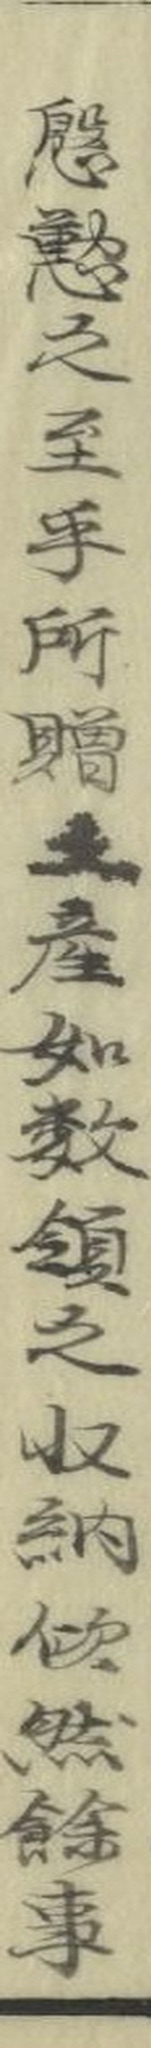慇懃之至乎所贈土産如数領之収納欣然余事
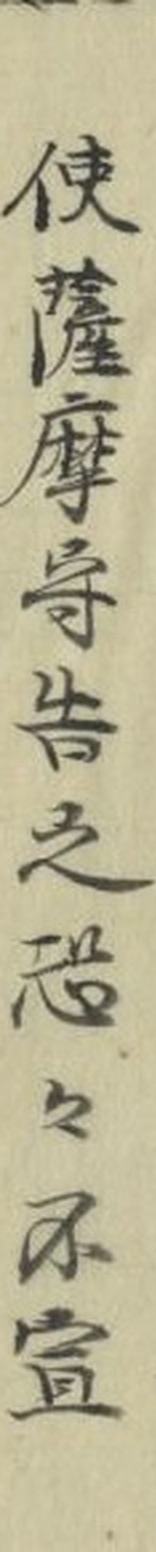使薩摩守告之恐々不宣
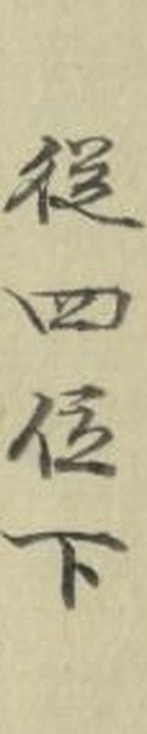従四位下
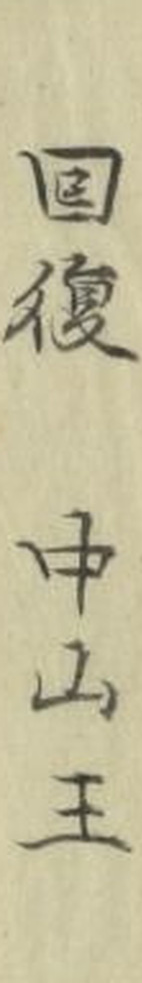回復中山王
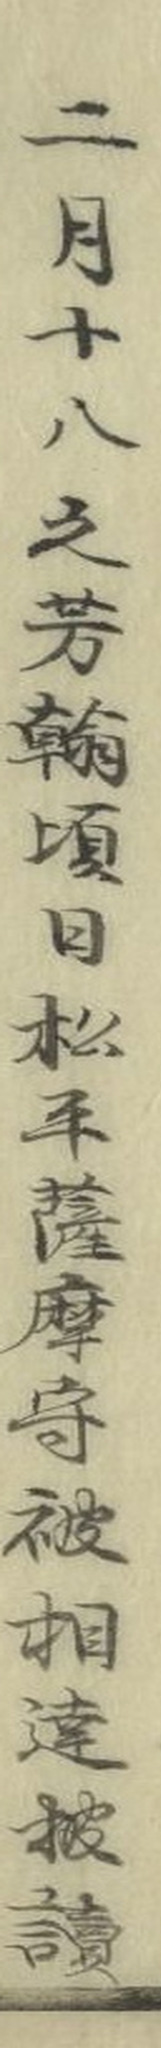二月十八日之芳翰頃日松平薩摩守被相達披読
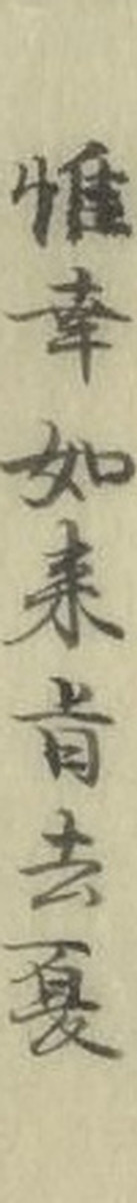惟幸如来旨去夏
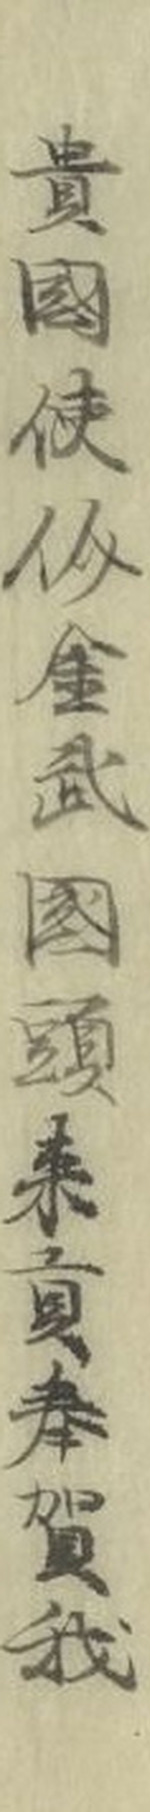貴国使价金武国頭来貢奉賀我
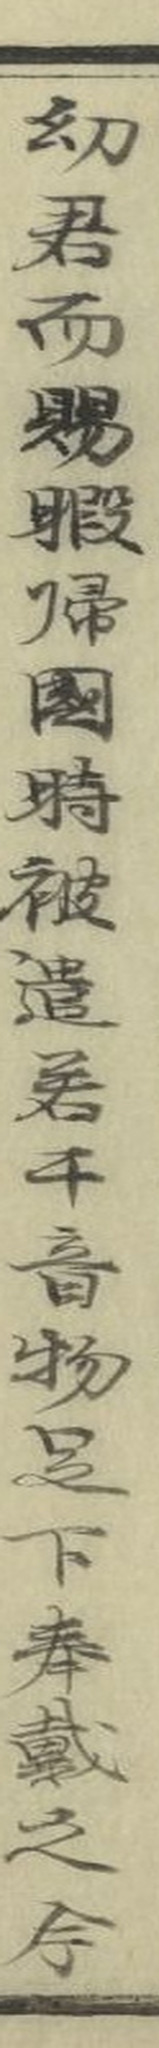幼君而賜暇帰国時被遣若干音物足下奉戴之今
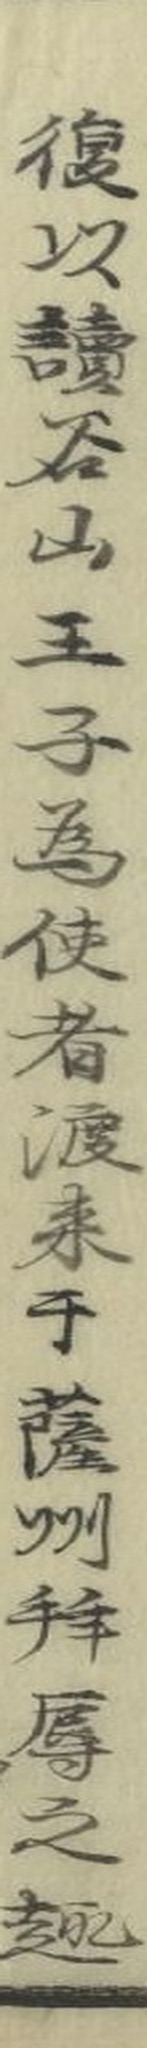復以読谷山王子為使者渡来于薩州拝辱之趣

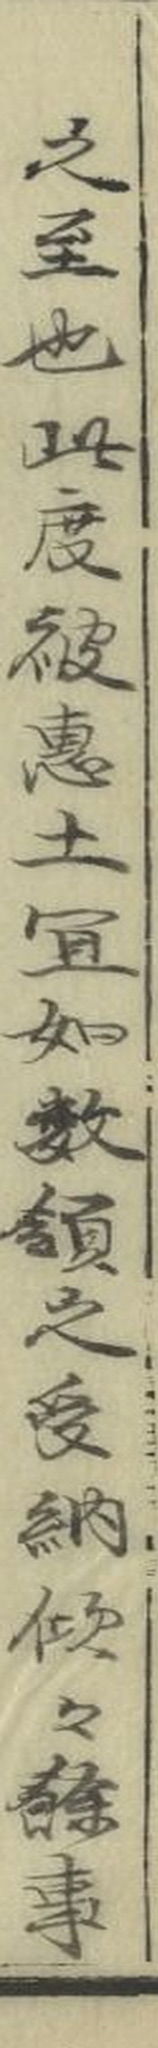之至也此度被恵土冝如数領之受納欣々余事
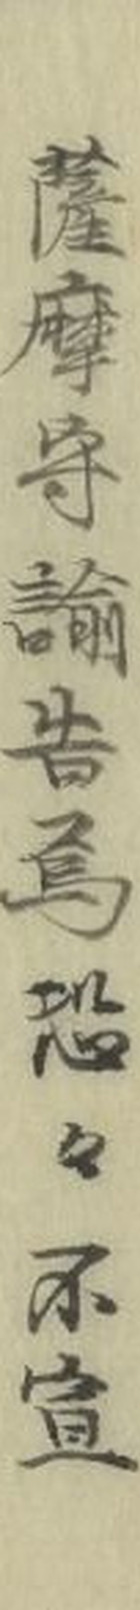薩摩守論告為き恐々不宣
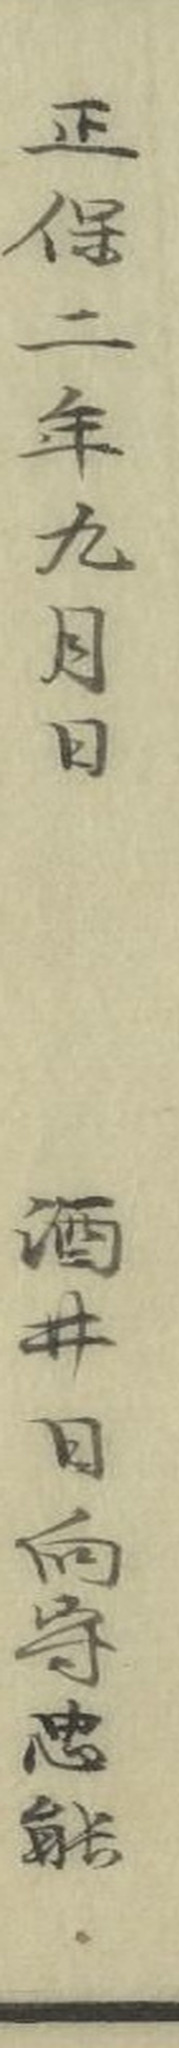正保二年九月月日酒井日向守忠能
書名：琉球往来（上）
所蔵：University of the Ryukyus Library
